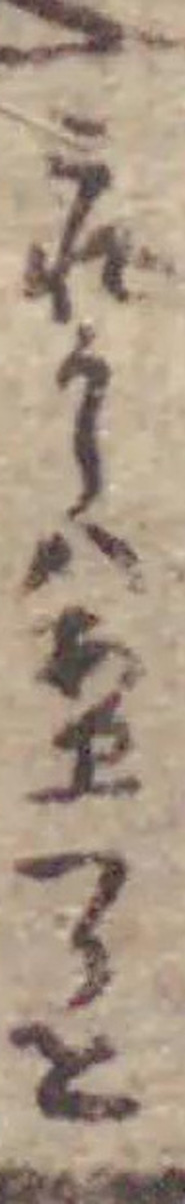これからはあヱつらを
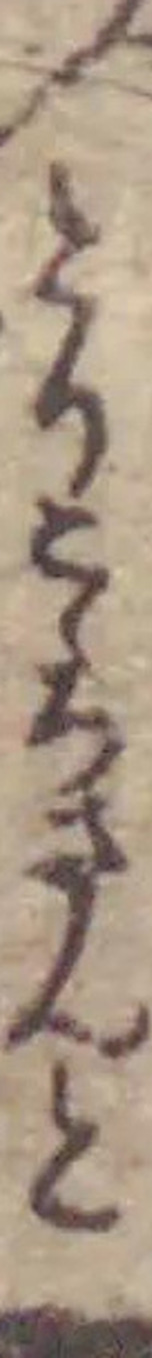とりころさんと
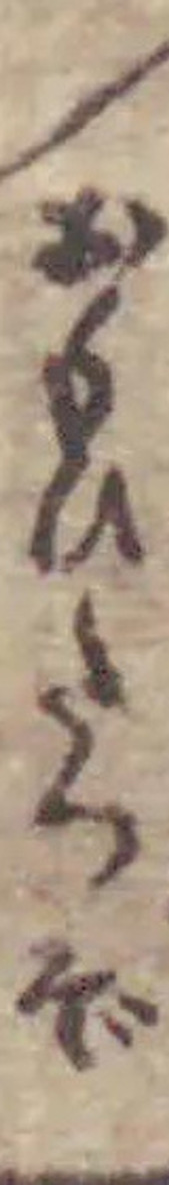おもひたつぞ
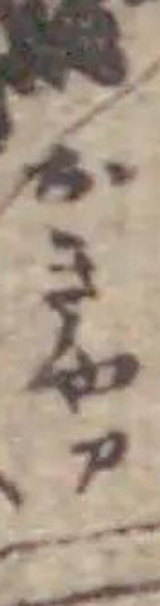おきやァ

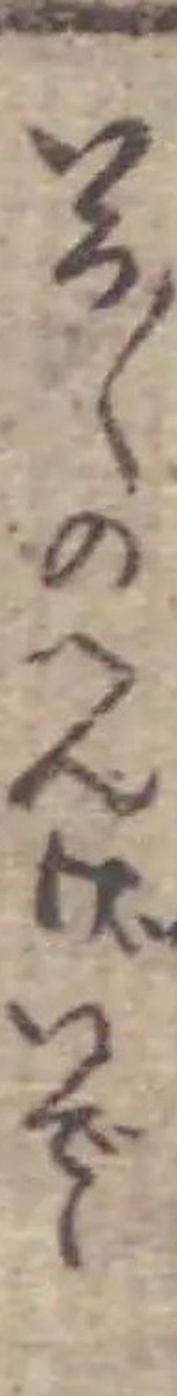いろ〳〵のへんげいでゝ
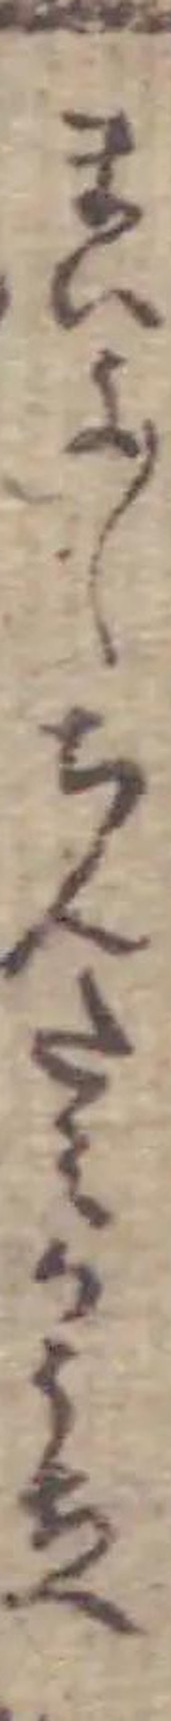まいよ〳〵ちんたみかうちへ
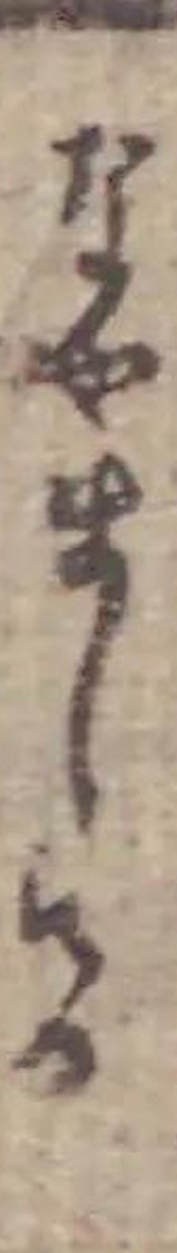なやましける
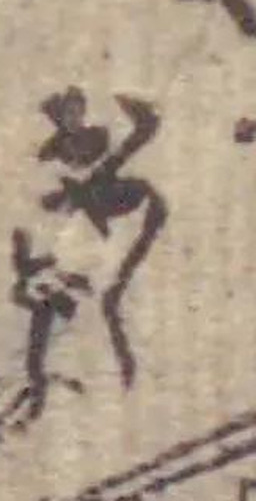おや〳〵
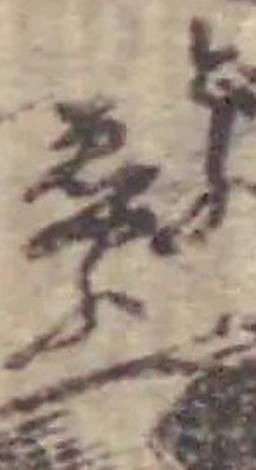しやふ
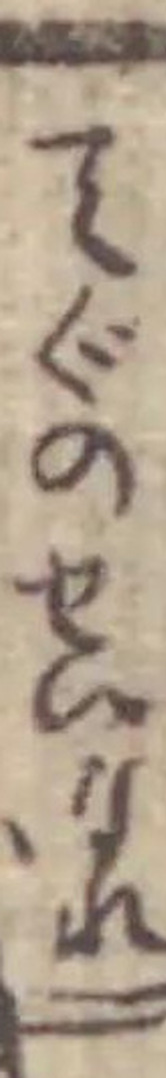天ぐのせひなれ
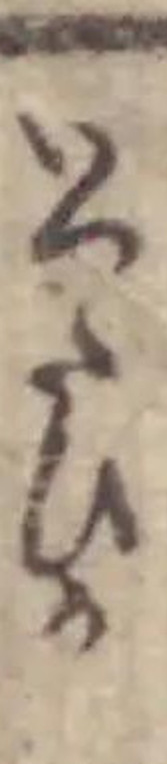いつたひか
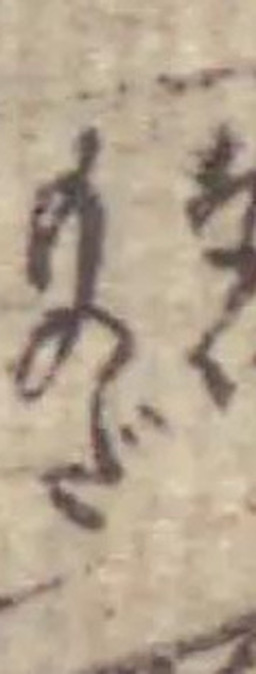ものだ
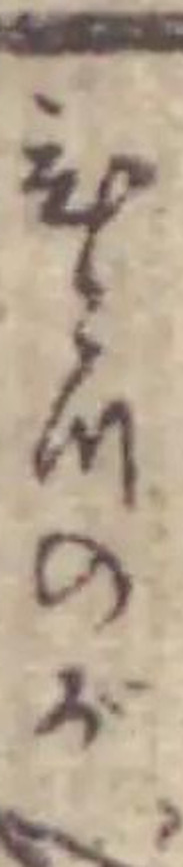ひとつのが
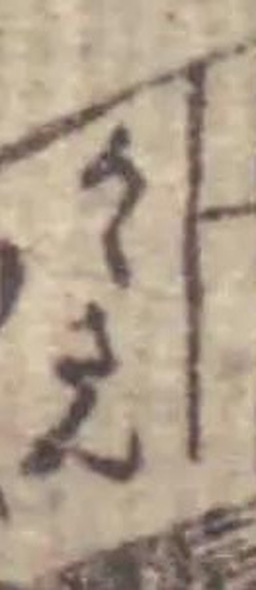かゝさん
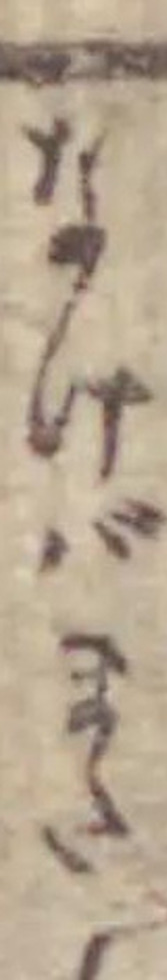なけばまた
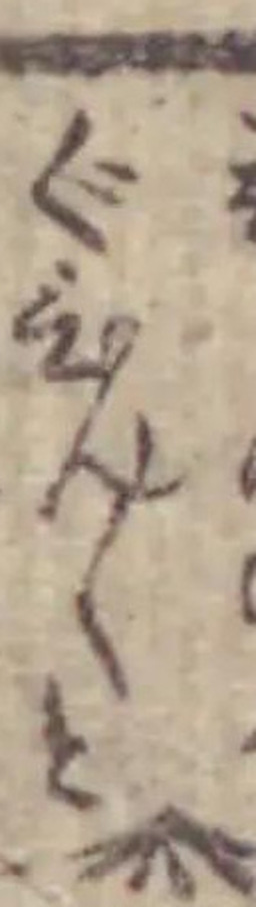ぐひん〳〵と
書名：通人為真似 2巻
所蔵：国立国会図書館 National Diet Library, JAPAN
